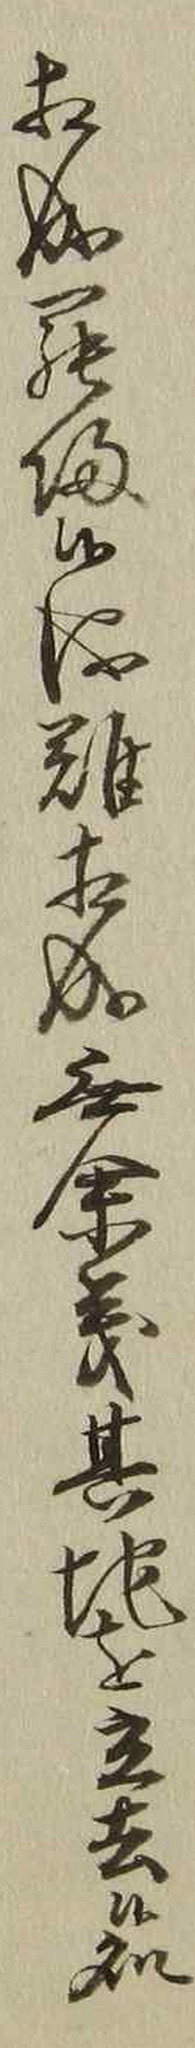相成罷帰候儀難相成無余義其地を立去候処
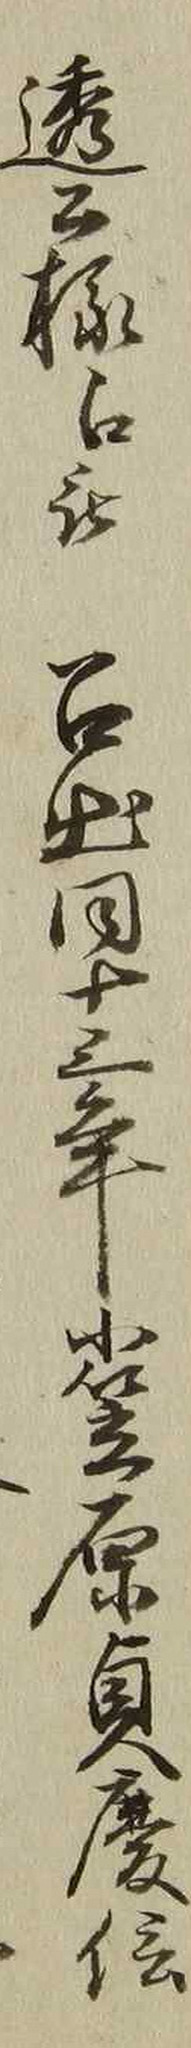透公様召被召出同十三年小笠原貞慶信
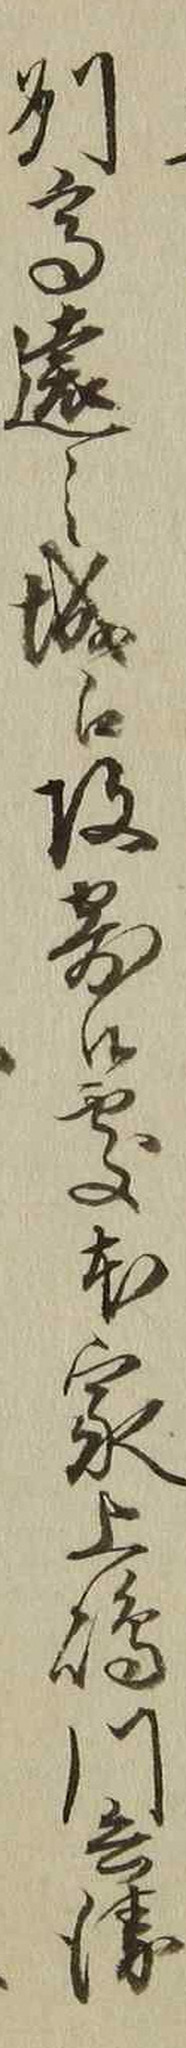州高遠之城江攻寄候處本家上島川兵衛
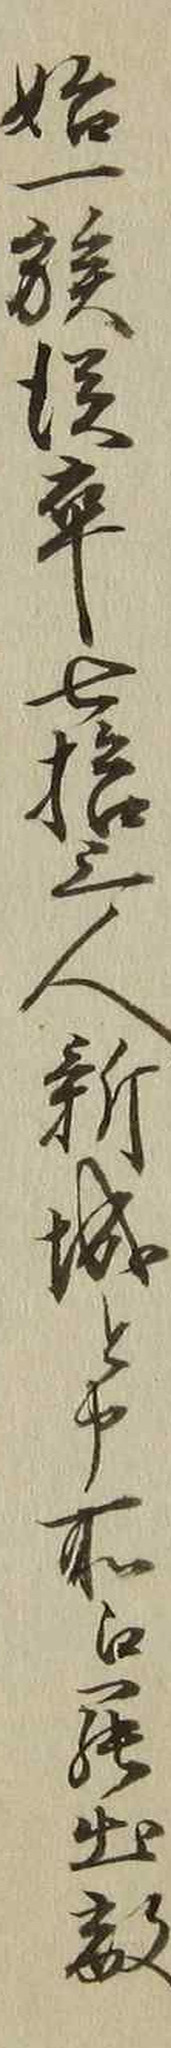始一族従卒七拾三人新城と申所江罷出敵
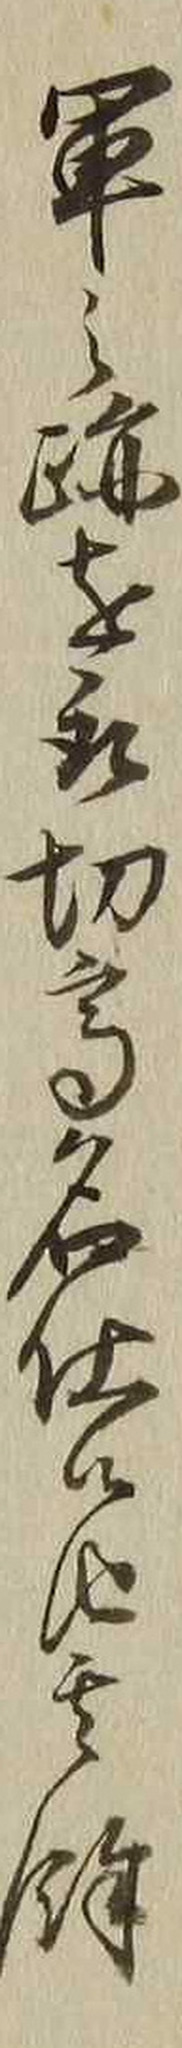軍之跡を取切高名仕候由其余
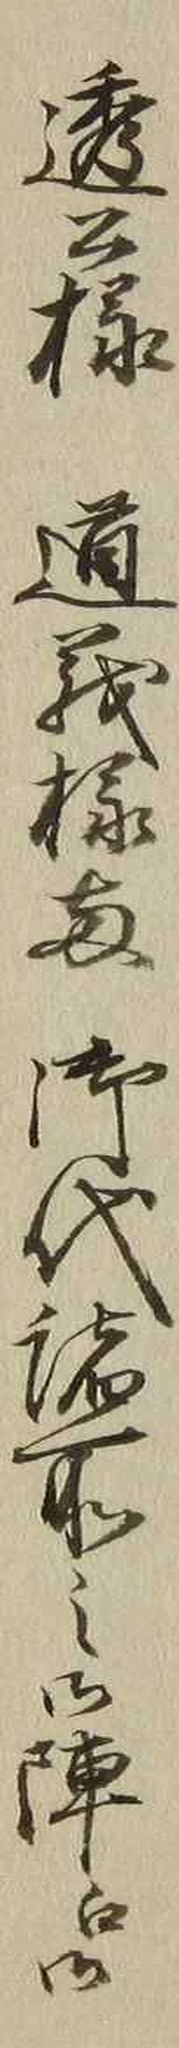透公様道義様両御代諸所之御陣江御
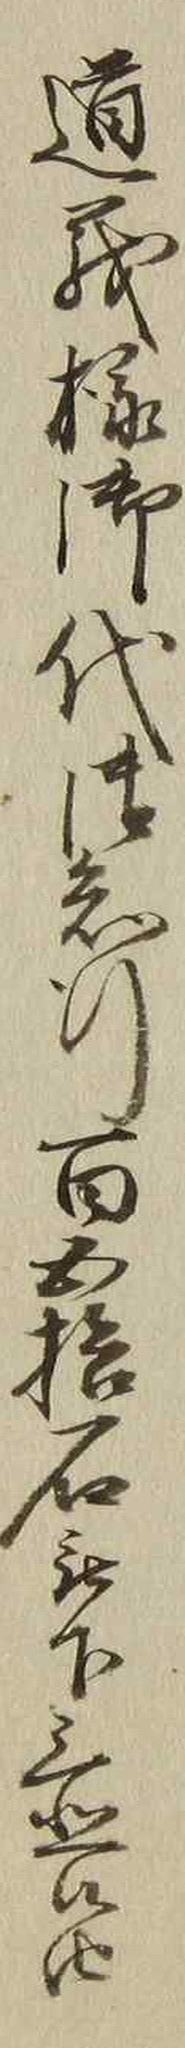道義様御代御知行百五拾石被下置候由
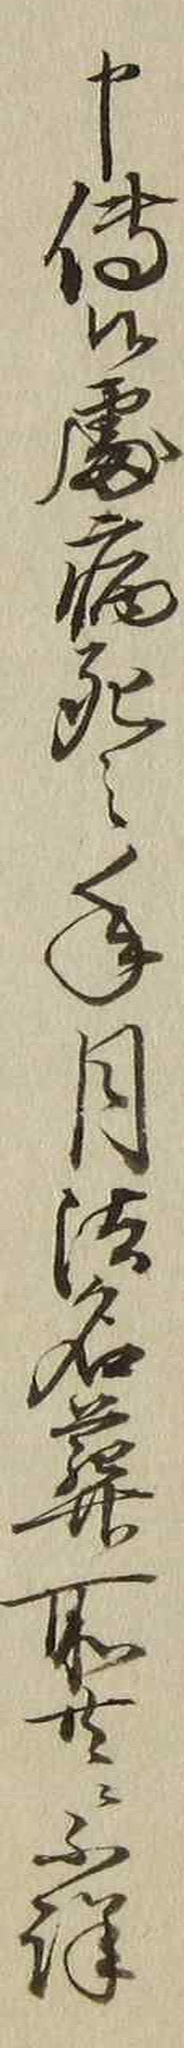申伝候處病死之年月法名葬所共ニふ詳
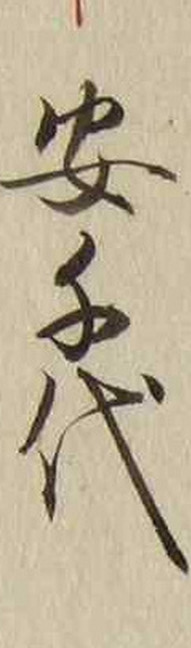安千代
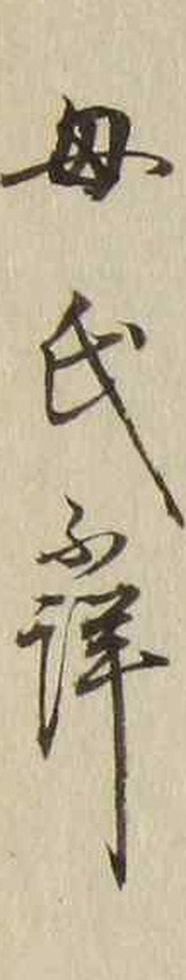母氏ふ詳

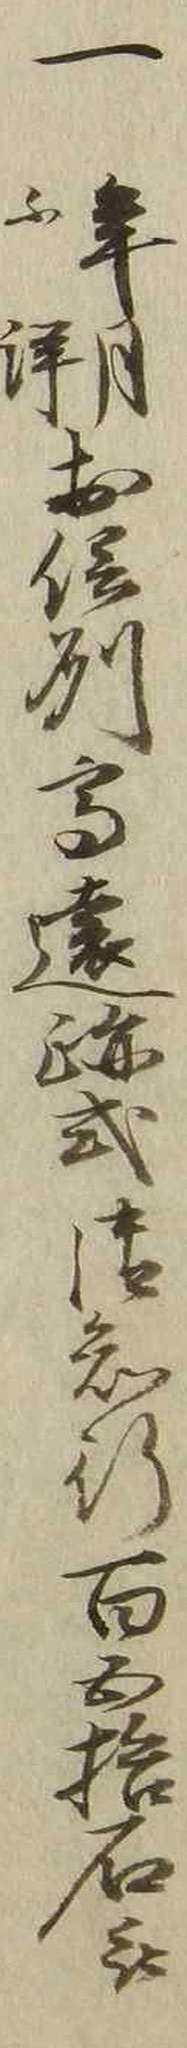一年月ふ詳お信州高遠跡式御知行百五拾石被
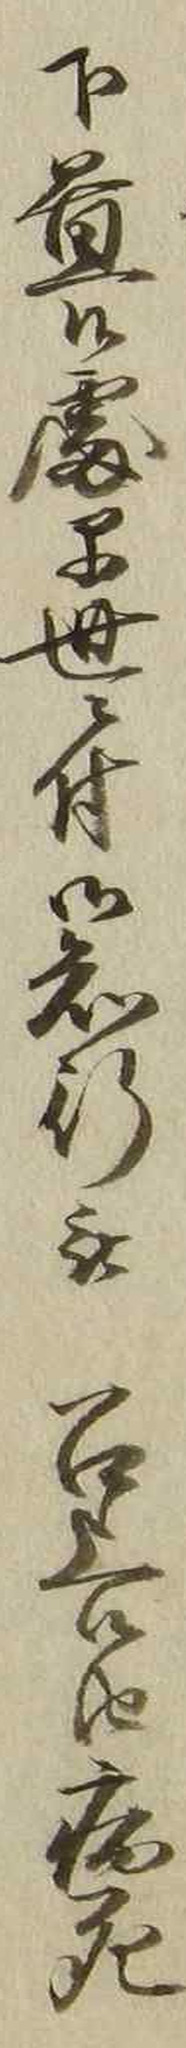下置候處早世二付御知行被召上候由病死
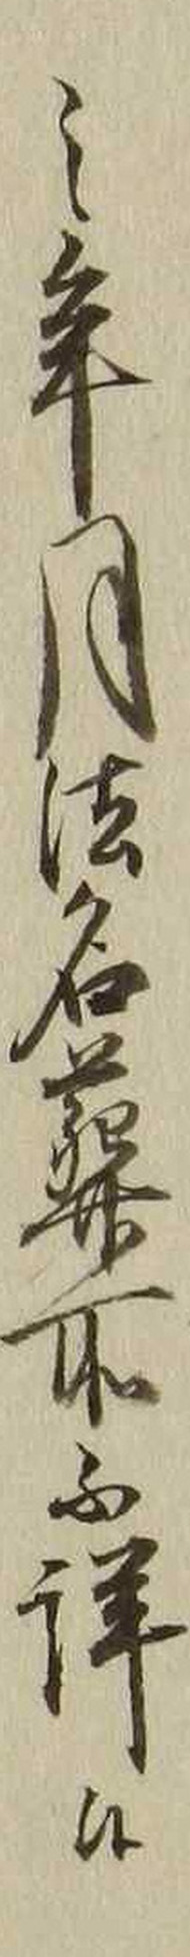之年月法名葬所ふ詳候
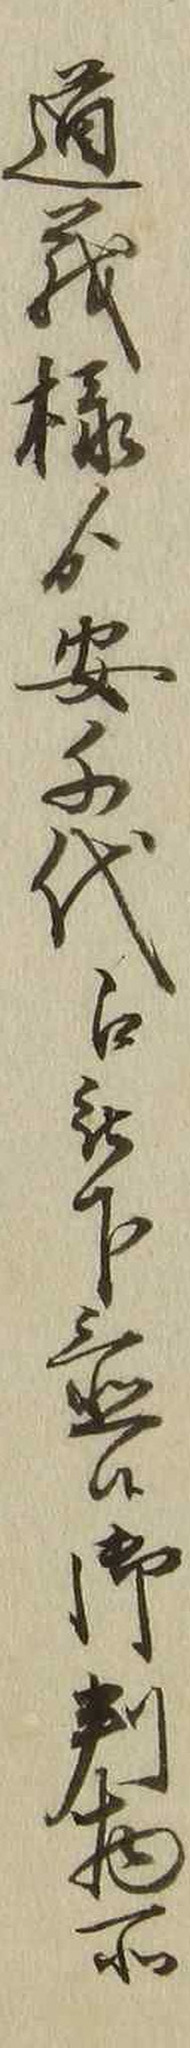道義様ゟ安千代江被下置候御判物所
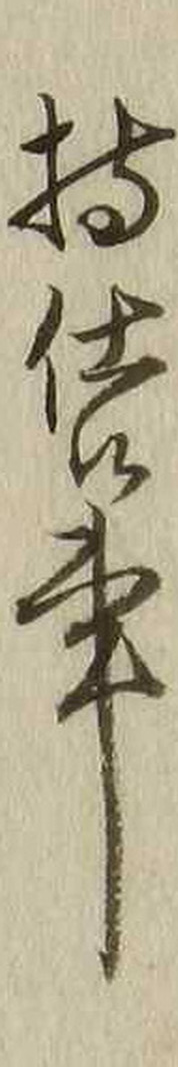持仕候事
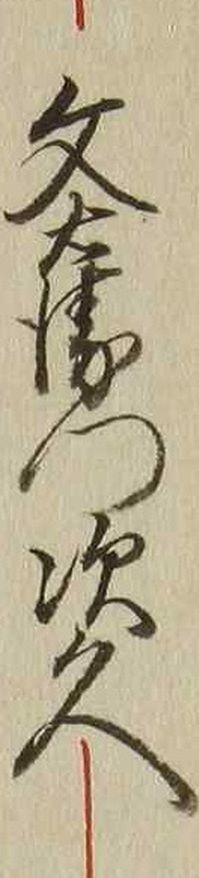文右衛門次久
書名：諸士系譜　巻之114　か之部22
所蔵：会津若松市立会津図書館
